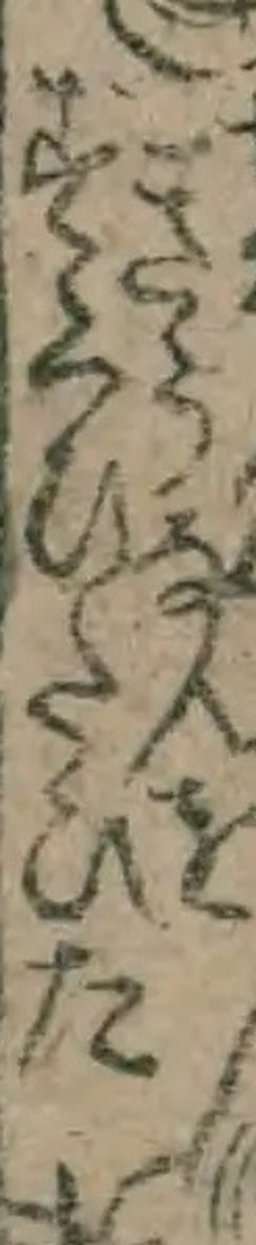すくひたまへ
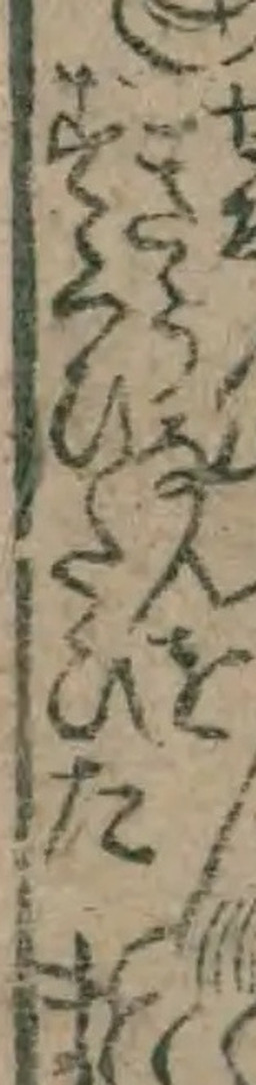すくひたまへ
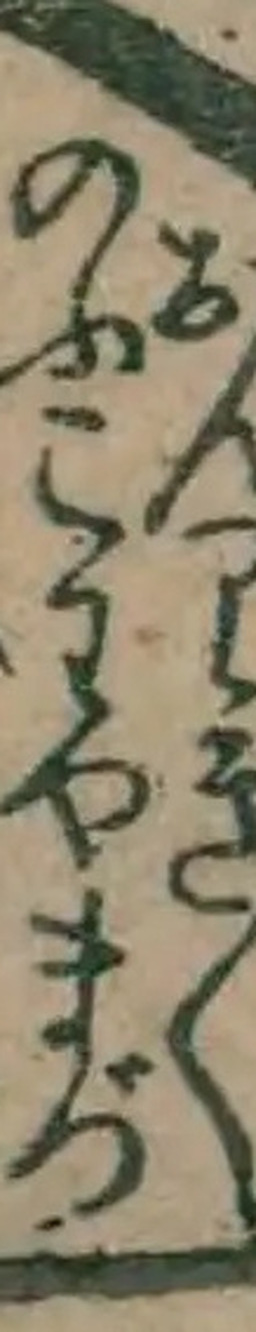のふこわやまづ
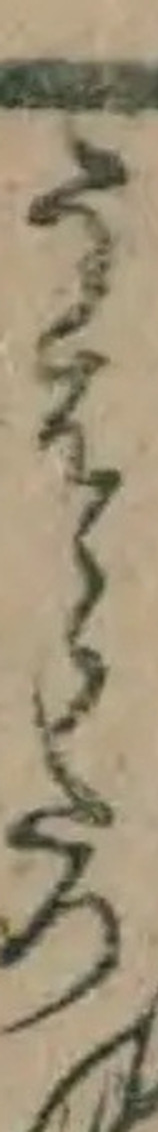うはらたつ
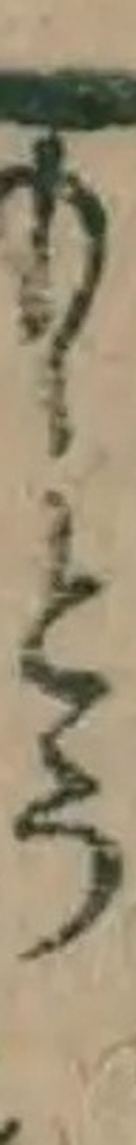もしとう
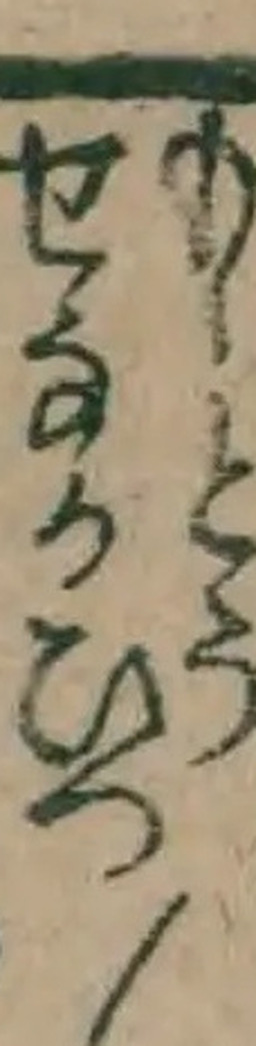せなかひつ
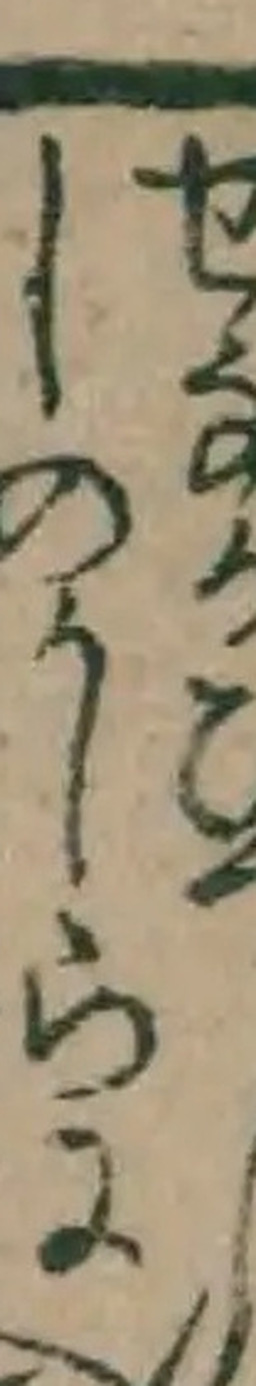しのかしらに
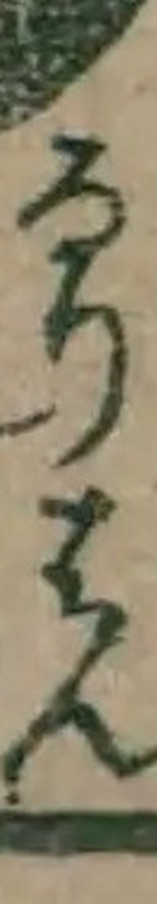るりはん
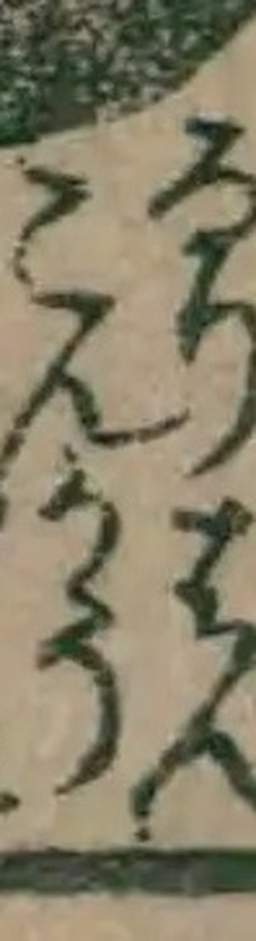こんかう
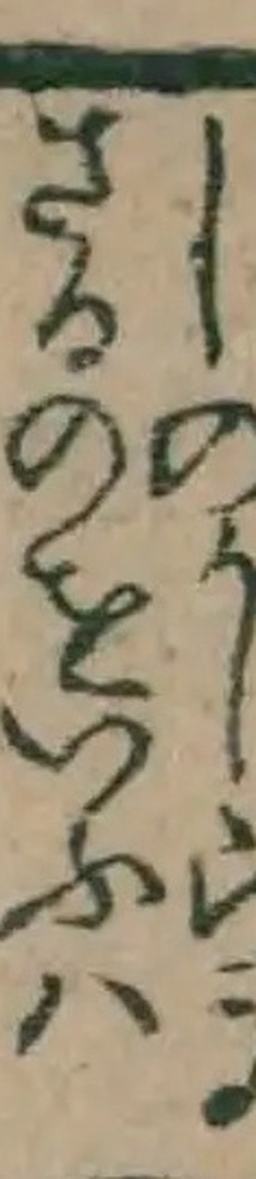さるのをいふは
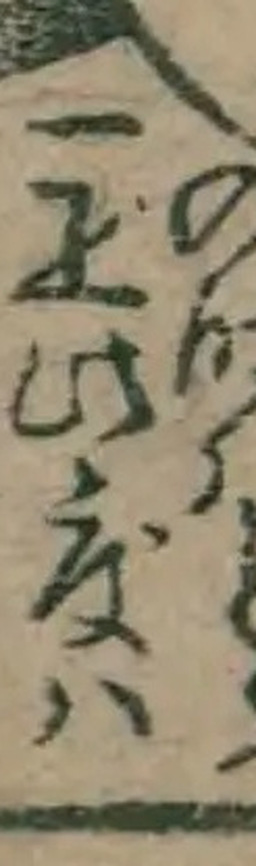一疋此度は
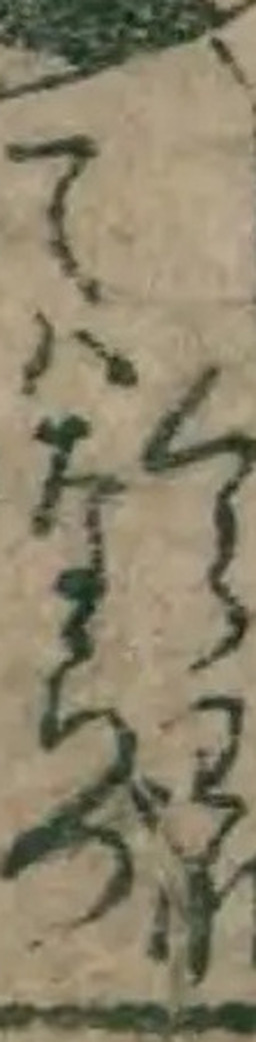てはならづ
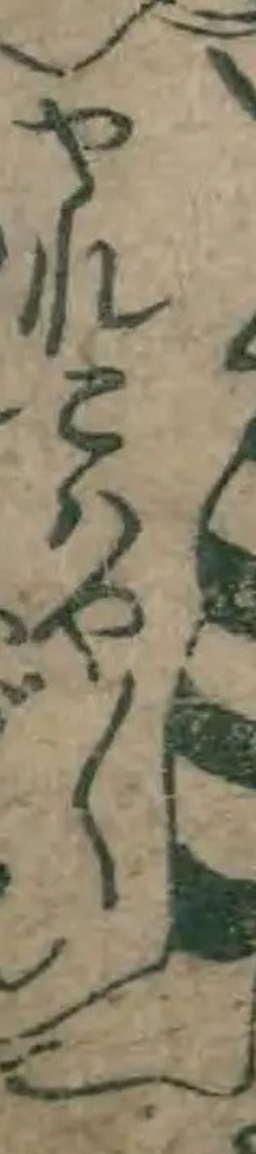やれこはや〳〵
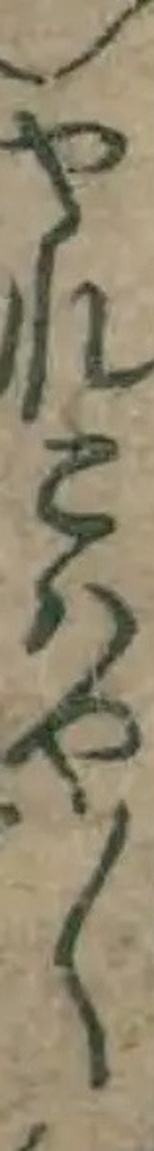やれこはや〳〵

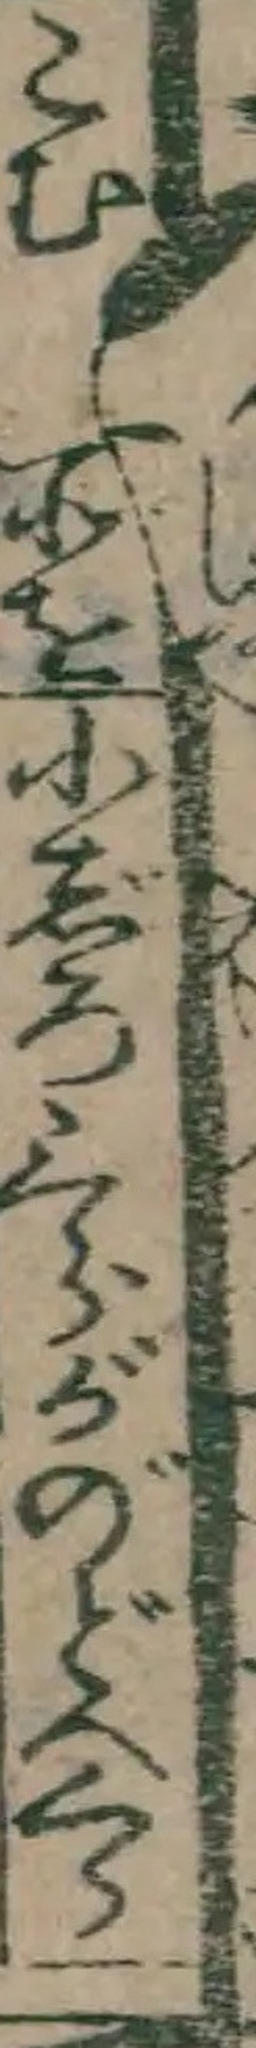こむ所をこじろ三郎がのどへくら
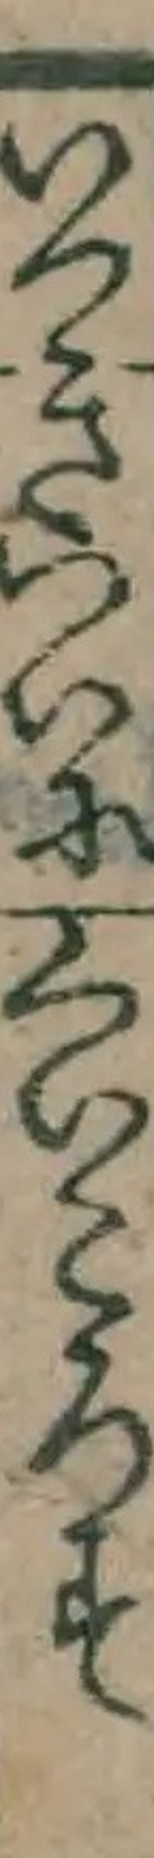いつきついにくいころす
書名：団十郎蓬芥伝
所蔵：国立国会図書館 National Diet Library, JAPAN
